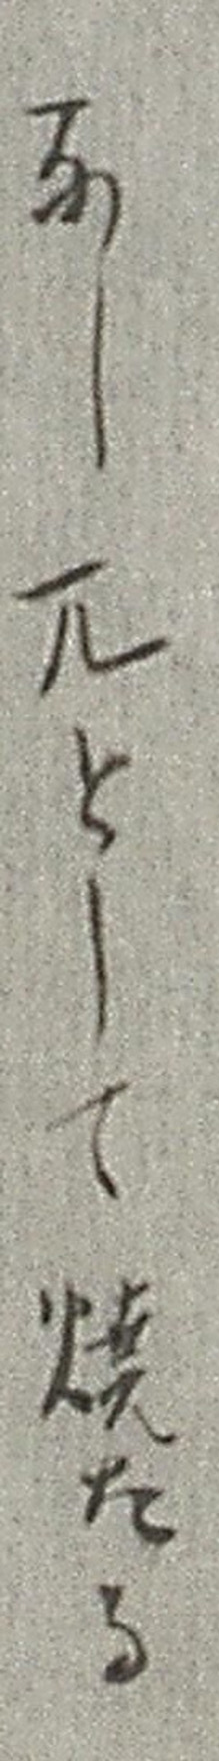なし兀として焼たる
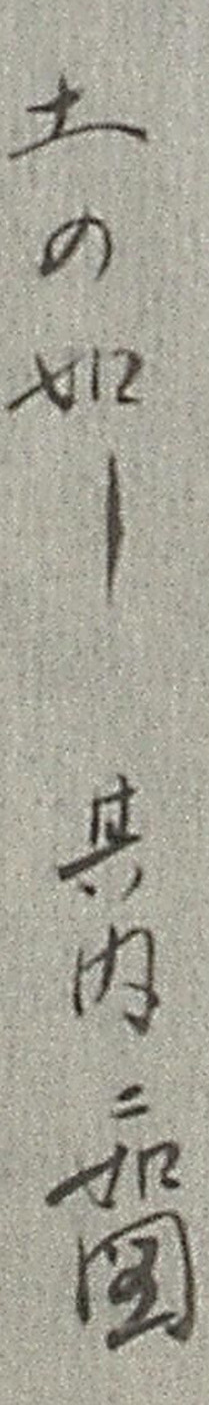土の如し其内ニ如図
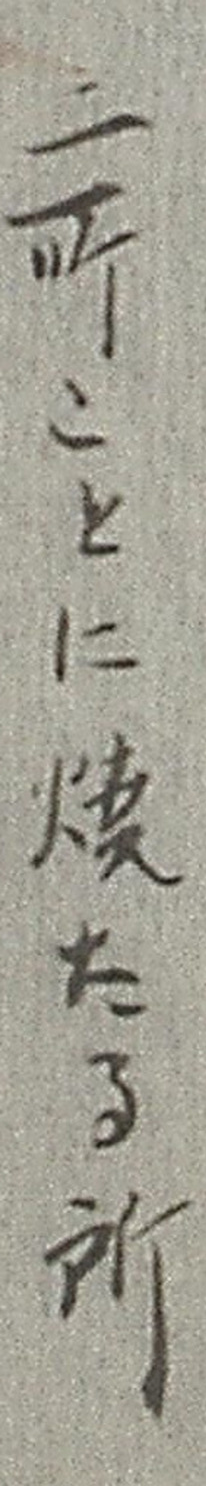二所ことに焼たる所
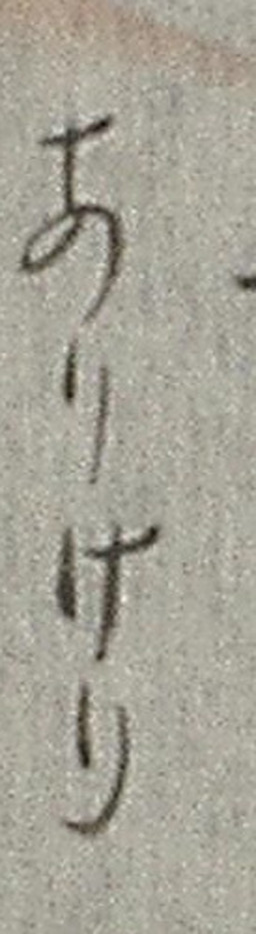ありけり

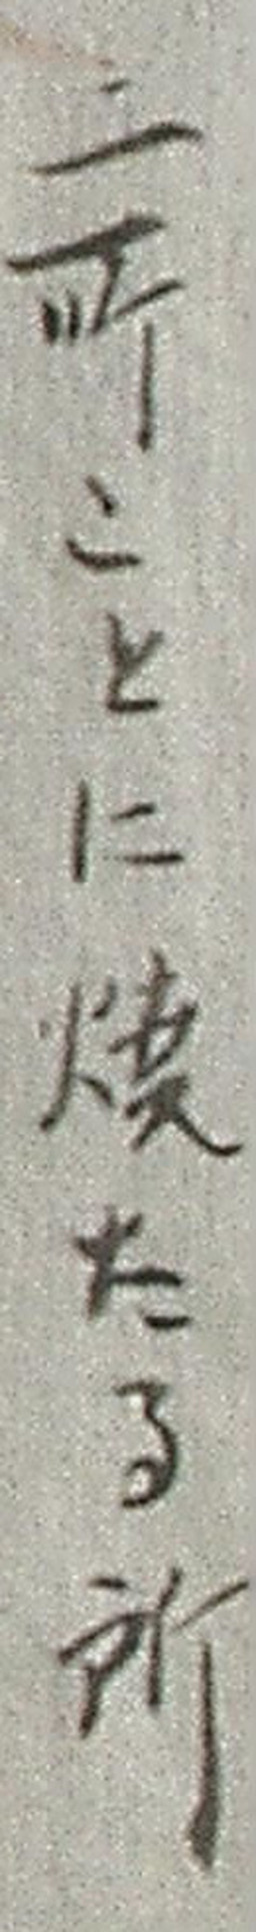一所ことに焼たる所
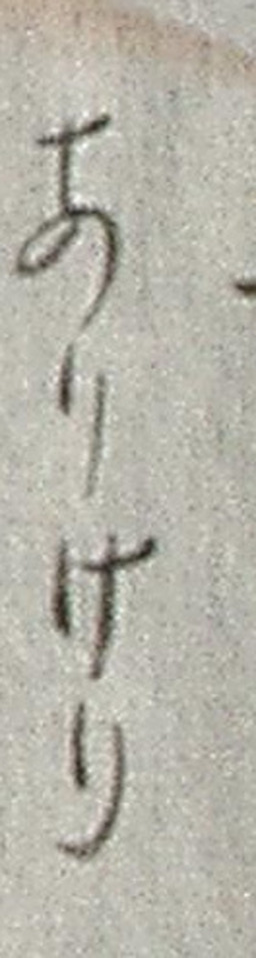ありけり
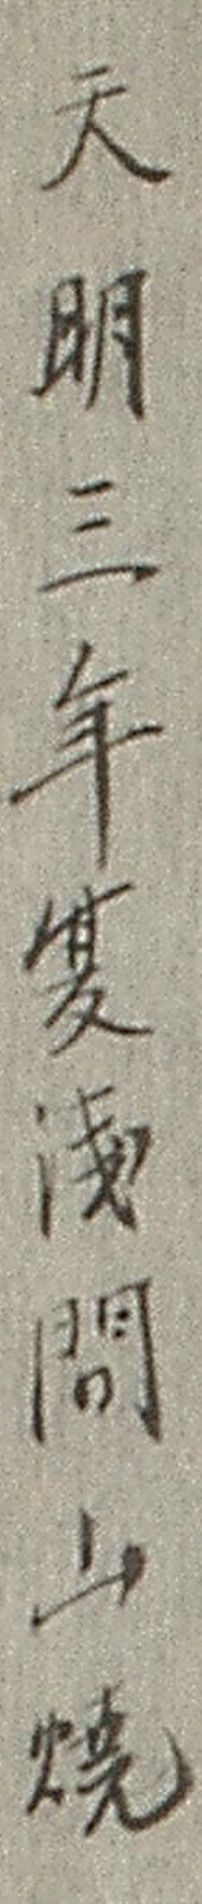天明三年夏浅間山焼
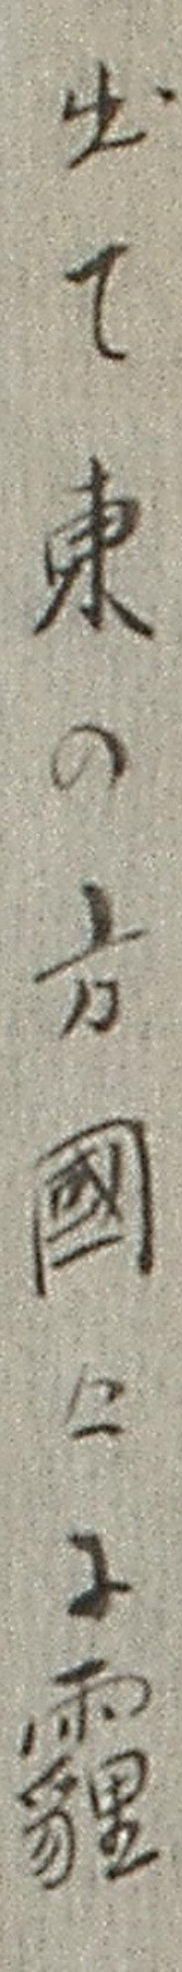出て東の方國々に霾
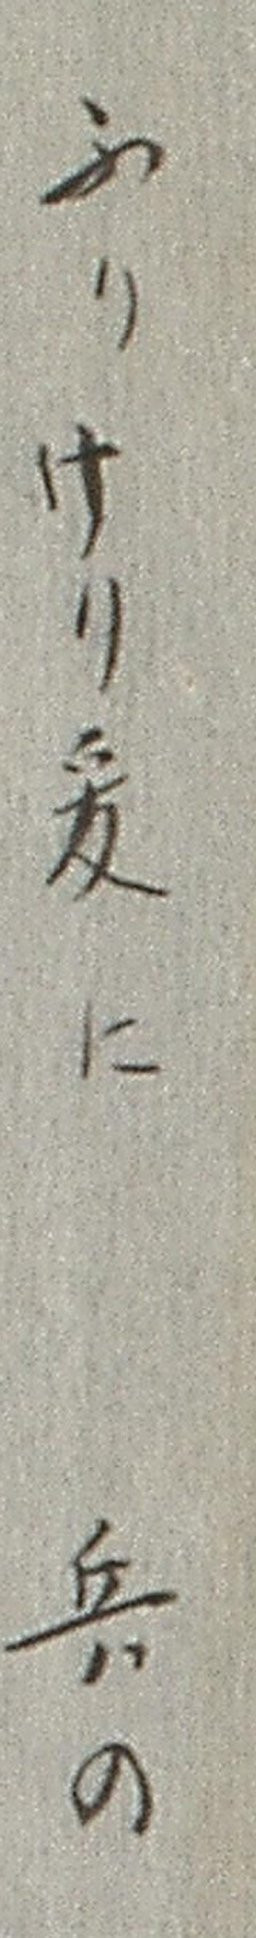ふりけり爰に兵の
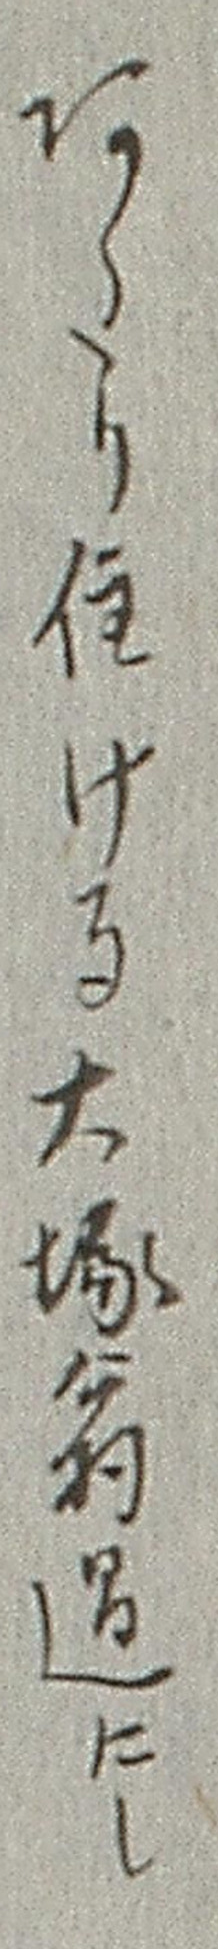あたり住ける大塚翁過にし
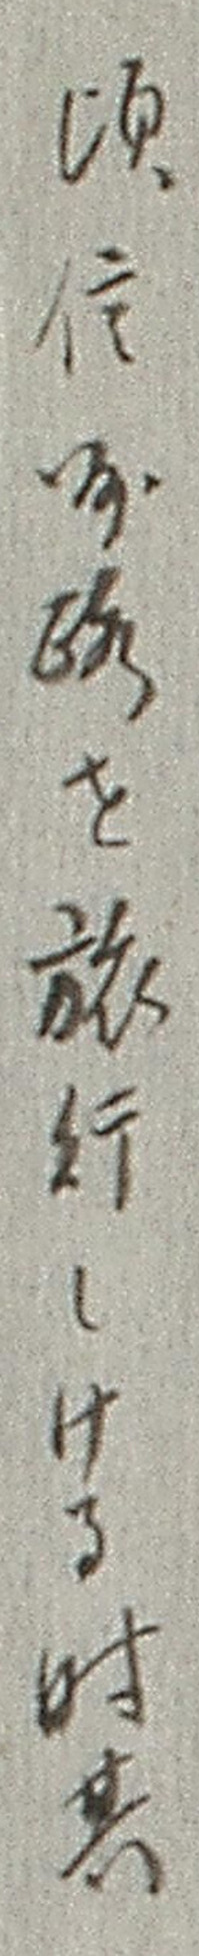頃信州路を旅行しける時其
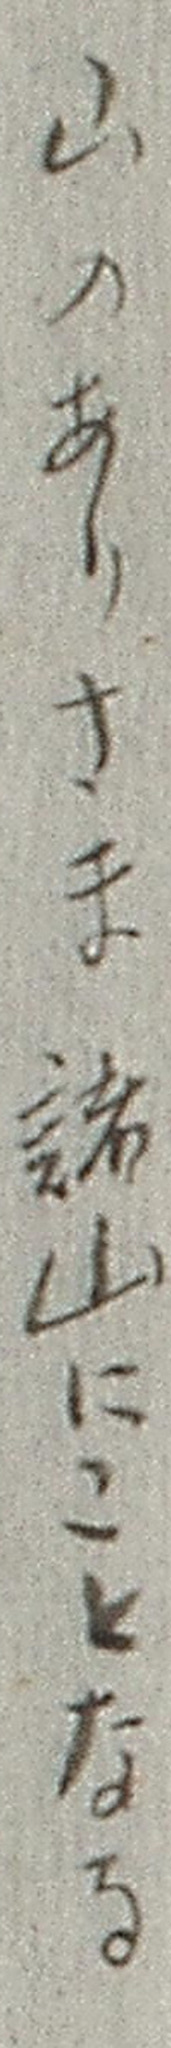山のありさま諸山にことなる
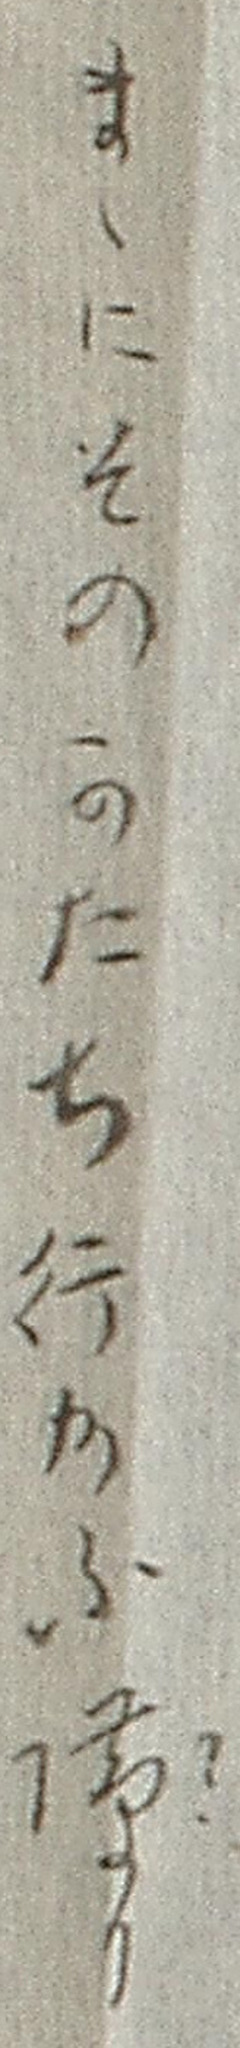まゝにそのかたち行なふ時より

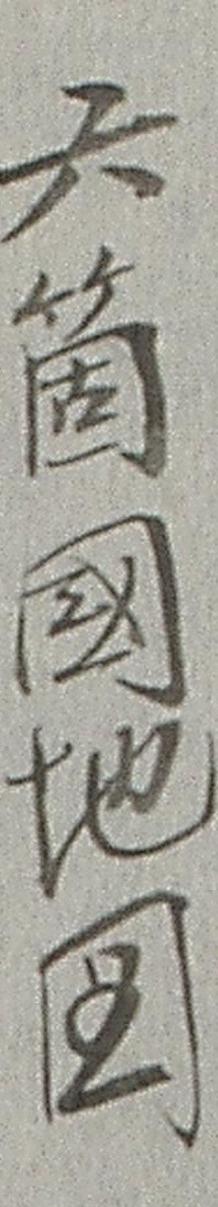六箇国地図
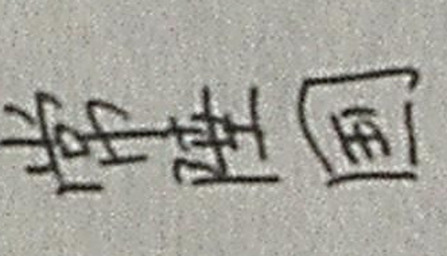常陸国
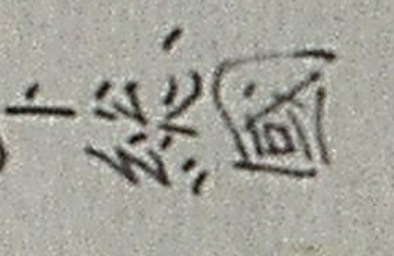下総国
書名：浅間山焼出記
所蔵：東京大学地震研究所図書室 Earthquake Research Institute Library, The University of Tokyo, JAPAN
